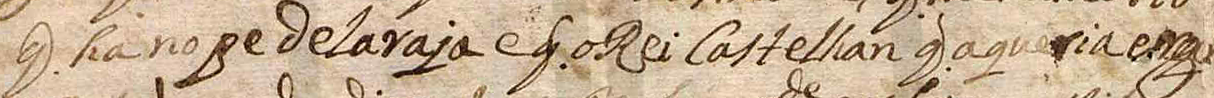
q̄. ha no pe de laraja e q̄. o Rei Castellan q̄. a queria errgu
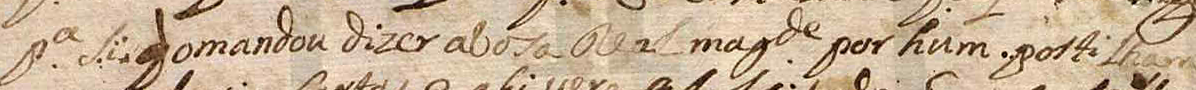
p.a si q̄ o mandou dizer a vosa Real mag.de por hum postilham
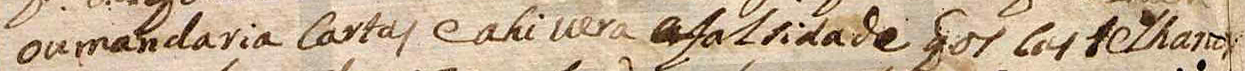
ou mandaria Cartas e ahi uera a falsidade q̄ os castelhanos
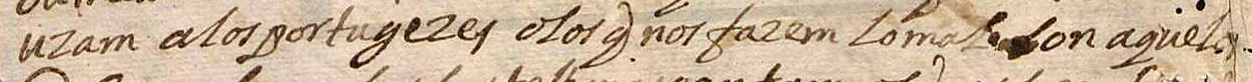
uzam a los portugezes e los q̄ nos fazem lo mal Con aquelos
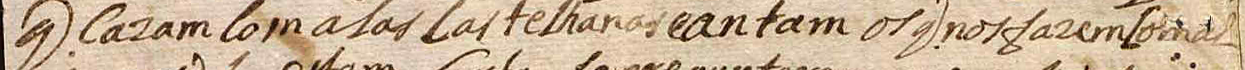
q̄ Cazam Com a los Castelhanos e antam os q̄. nos fazem [o mal
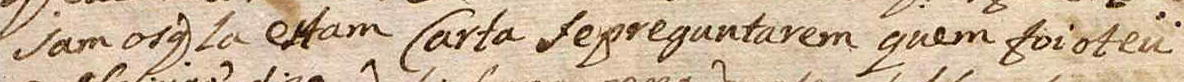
sam os q̄ la estam Carta se preguntarem quem foi o teu
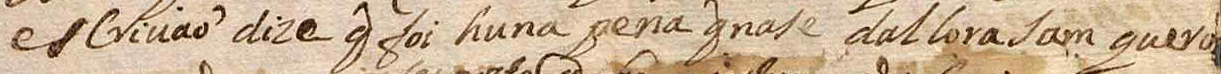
esCriuaõ dize q̄ foi huna pena q̄ nase dal Corasam quero
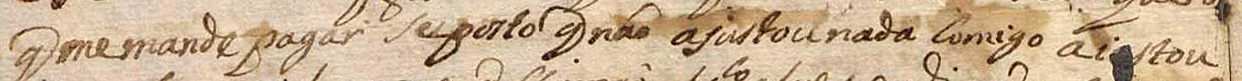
q̄ me mande pagar suposto q̄ naõ ajustou nada comigo ai_stou
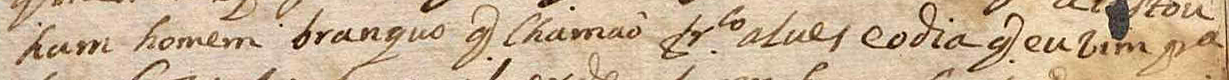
hum homem branquo q̄ Chamaõ fr.co alues e o dia q̄ eu vim pa
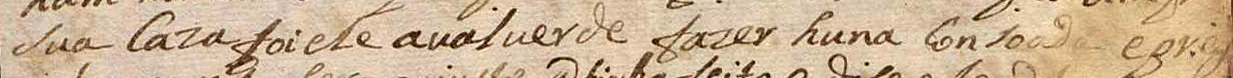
sua Caza foi ele a ualuerde fazer huna consoada e preg
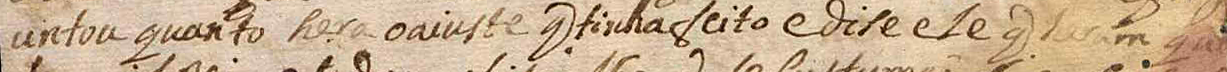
untou quanto hera o aiuste q̄ tinha feito e dise ele q̄ seram qu
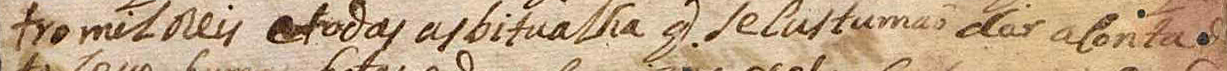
tro mil Reis e todas as bitualha q̄ se Custumaõ dar a Conta d
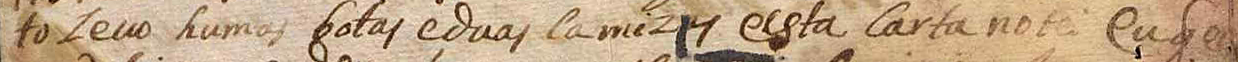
to Leuo humas botas e duas camiz_s e esta Carta notei Eu q̄ o
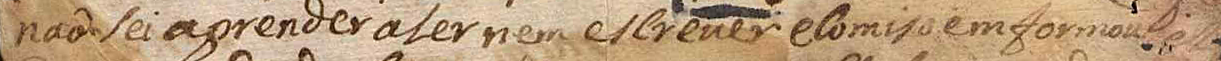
naõ sei aprender a ler nem esCreuer e com iso emformou el
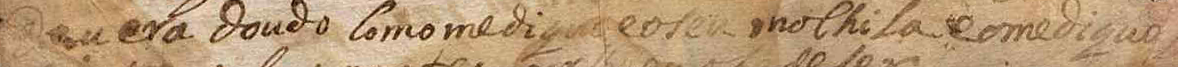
q̄. eu era doudo Como mediquo e o seu moChila e o mediquo
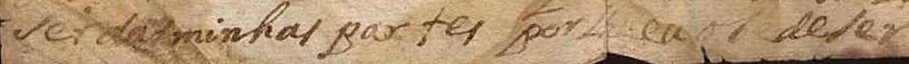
ser das minhas partes por lhe eu obedeser
